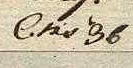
C no 36
